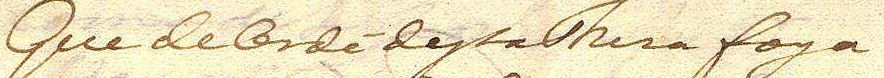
Que de Ordē desta Meza foy a
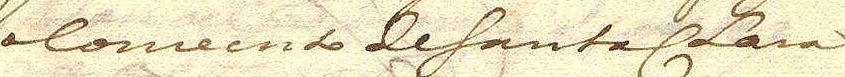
o Convento de Santa CLara
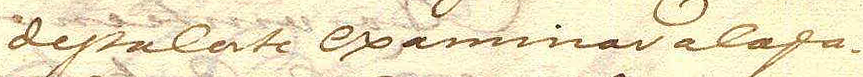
desta Corte examinar a capa
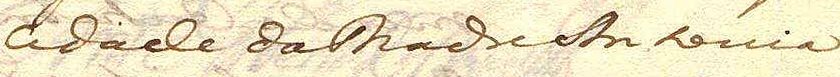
cidade da Madre Antonia
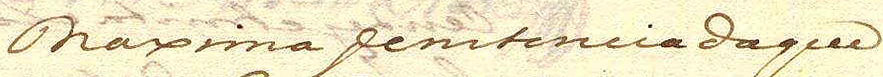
Maxima penitenciada que
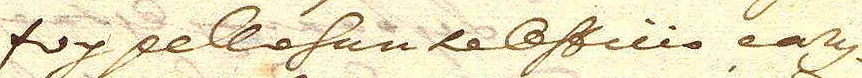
foy pello santo Officio e a res
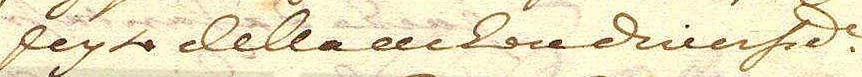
peyto della achou diversid.e
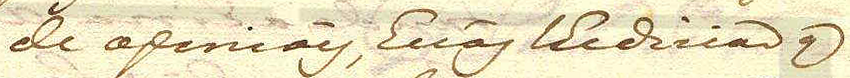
de openiões, huās lhe diziaõ q̄
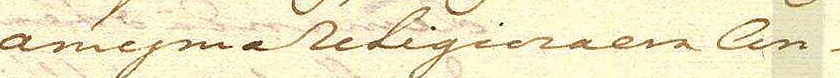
a mesma Religioza era Con
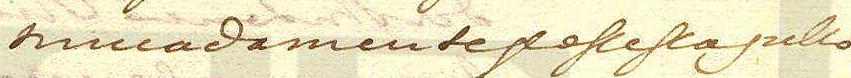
tinuadamente possessa pello
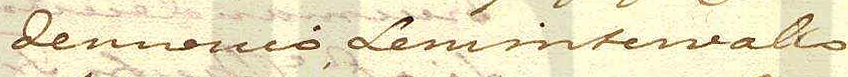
demonio, sem intervallo
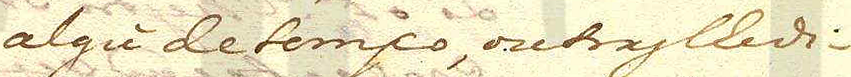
algū de tempo, outras lhe di
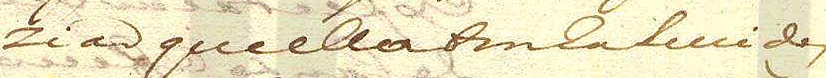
ziaõ que ella tinha lucidos
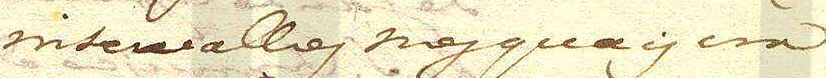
intervallos nos quais era
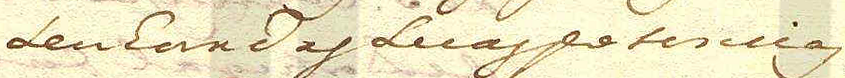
senhora das sua potencias
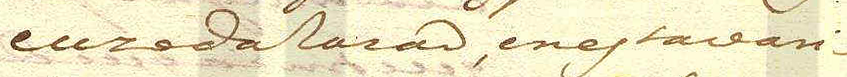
e uzo da Razaõ, e nesta vari
